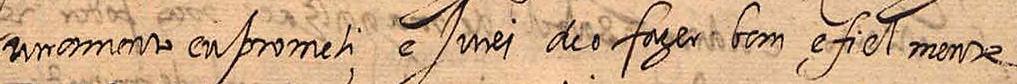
iuramento eu prometi, e Jurei de o fazer bem e fielmente
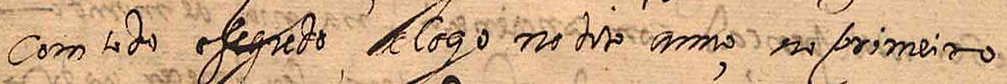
com todo o segredo, e logo no dito anno, no primeiro
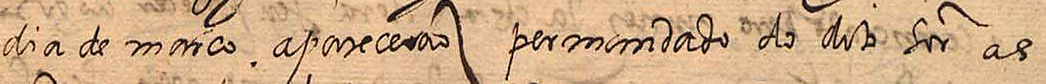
dia de março aparecerão per mandado do dito sor̄ as
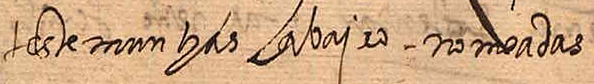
testemunhas abajxo nomeadas
